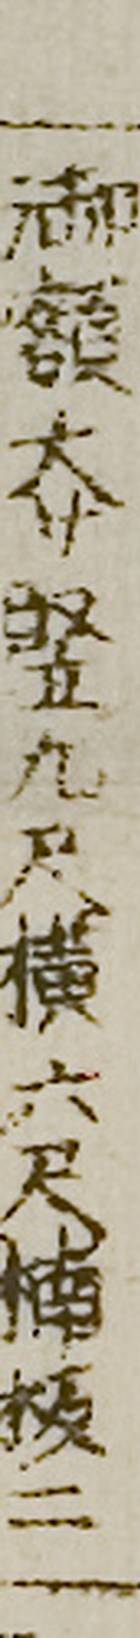御額大さ竪九尺横六尺楠板二
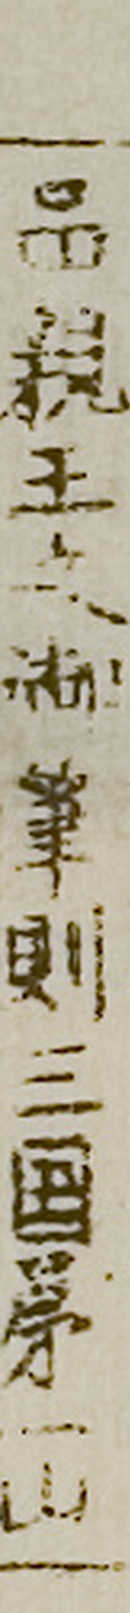品親王の御筆則三国第一山
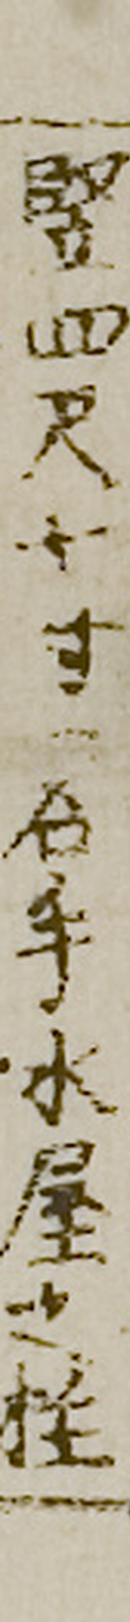竪四尺七寸の石手水屋の柱
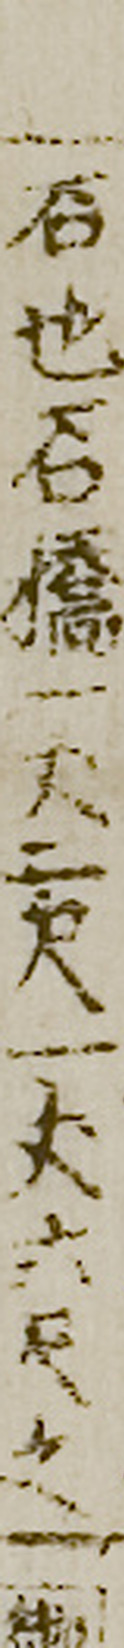石也石橋一丈二尺一丈六尺の
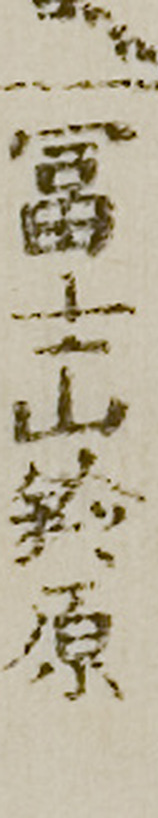富士山鈴原
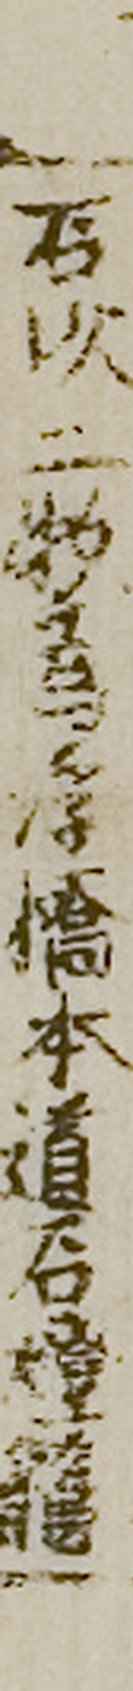石以二牧為浮橋本道石燈篭
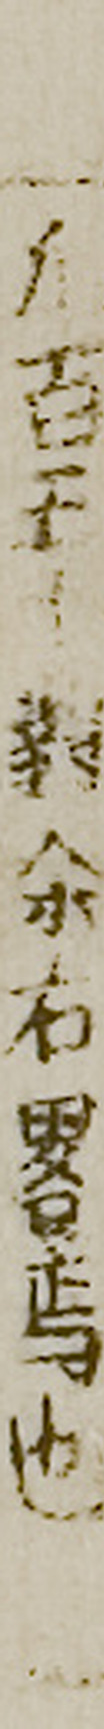凡百五十対余右略焉也
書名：富士山神宮麓八海北口正面略絵図
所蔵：東京大学総合図書館 General Library in the University of Tokyo, JAPAN
